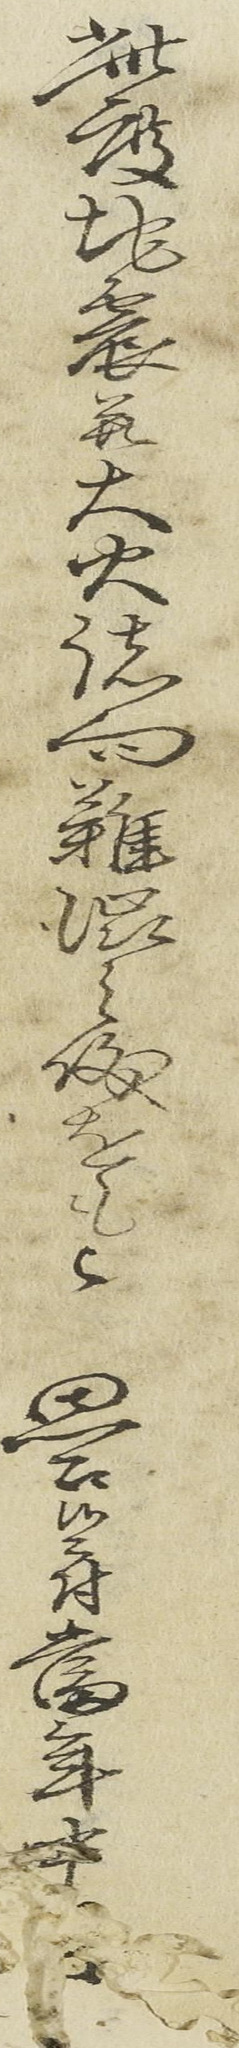此度地震并大火諸向難渋之儀をも被思召候ニ付当年中
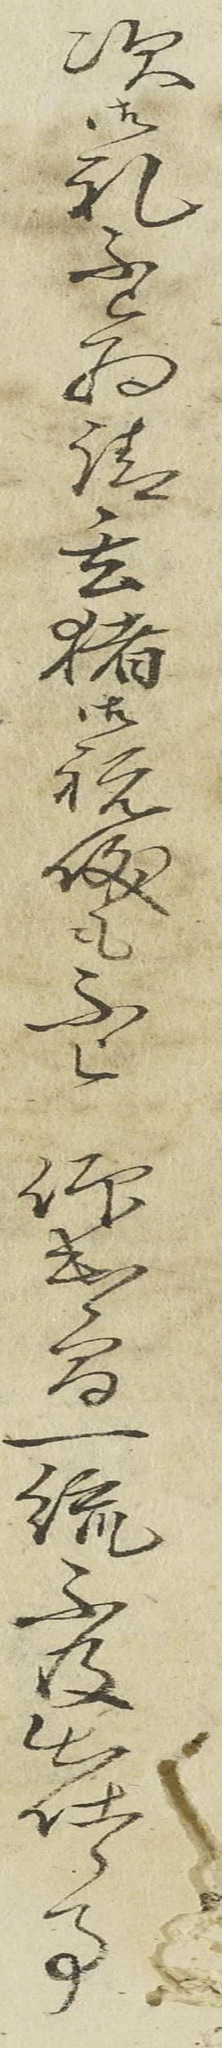次御礼不被為請玄猪御祝儀も不被仰出候間一統不及出仕候事
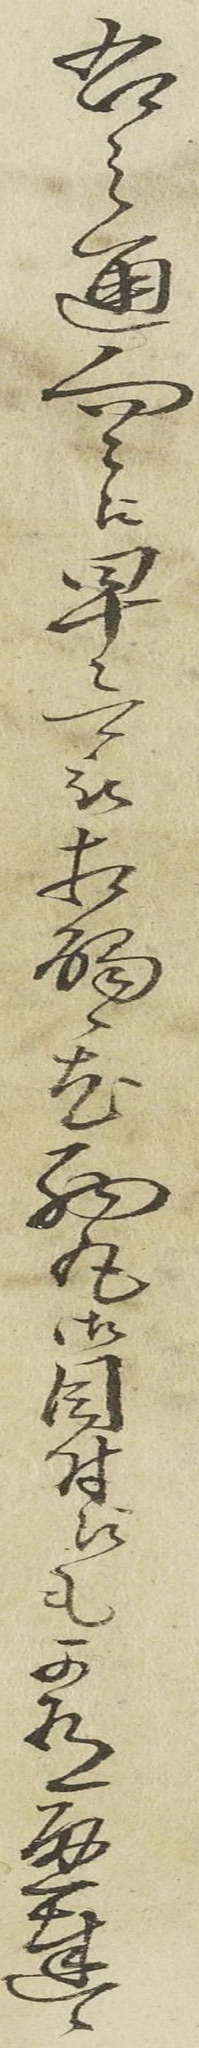右之通向々江早々可被相触候尤西丸御目付江も可有通達候
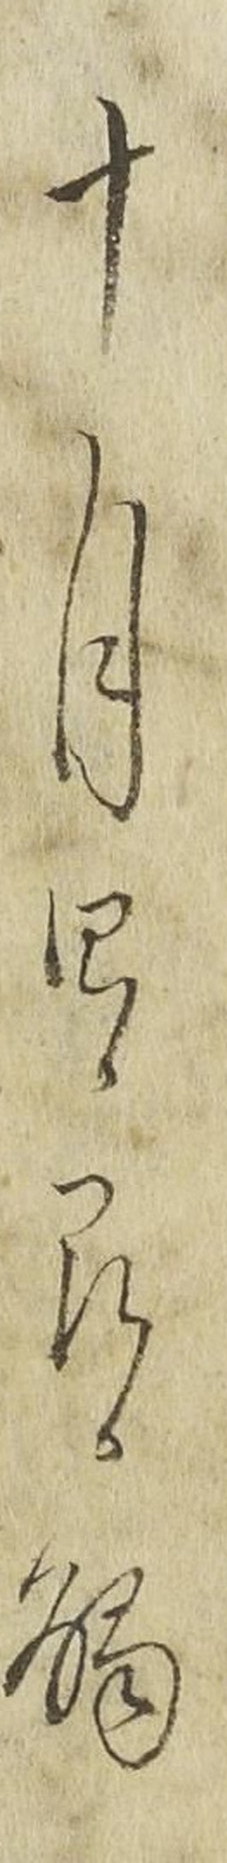十月四日即日触
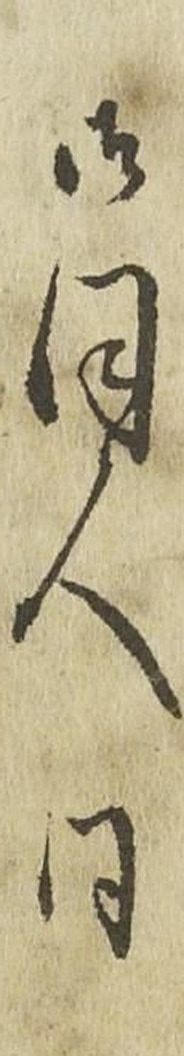御同人同
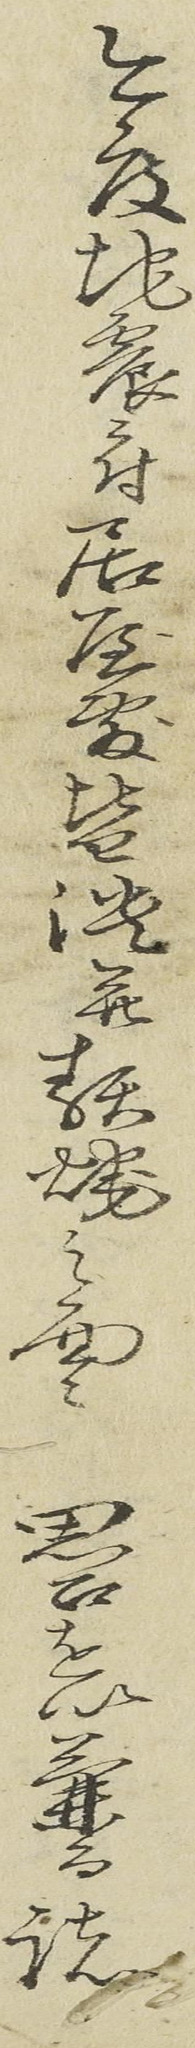今度地震ニ付居屋敷皆潰并類焼之面々思召を以兼而諸

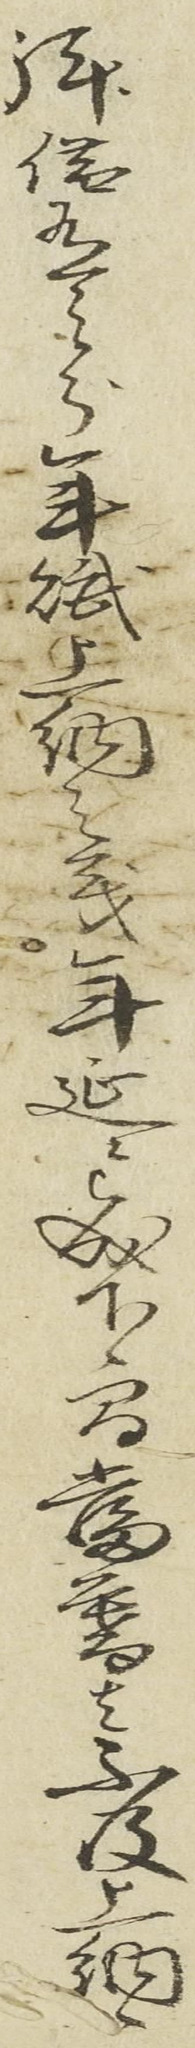拝借有之分年賦上納ノ義年延ニ被成下候間當暮は不及上納候
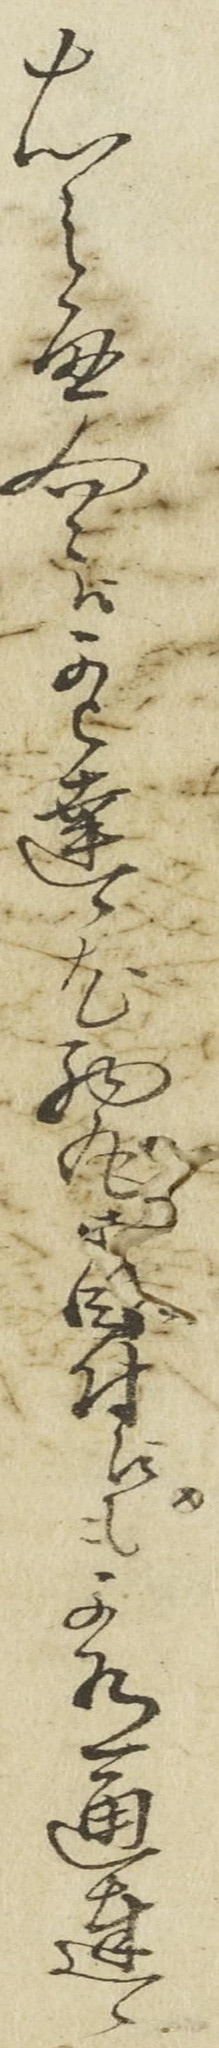右之通向々江可被達候尤西丸御目付江も可有通達候
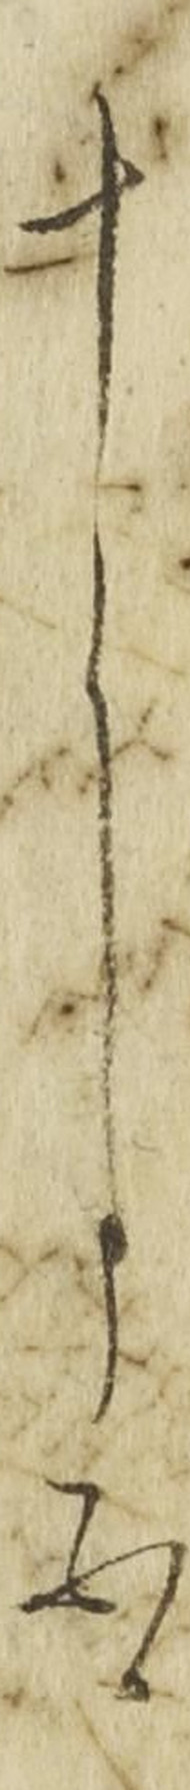十月五日
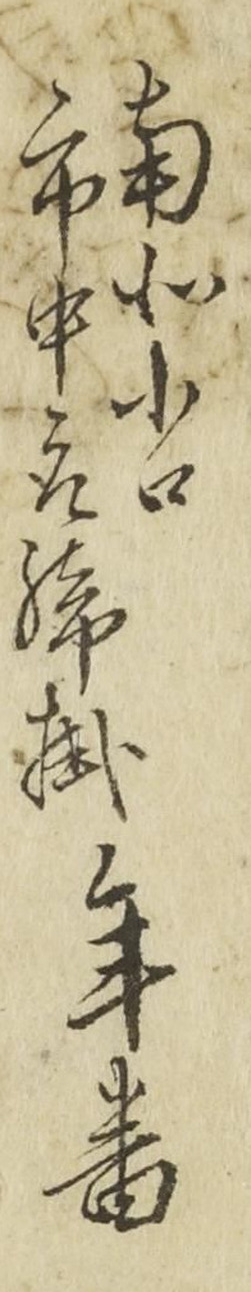市中取締掛年番
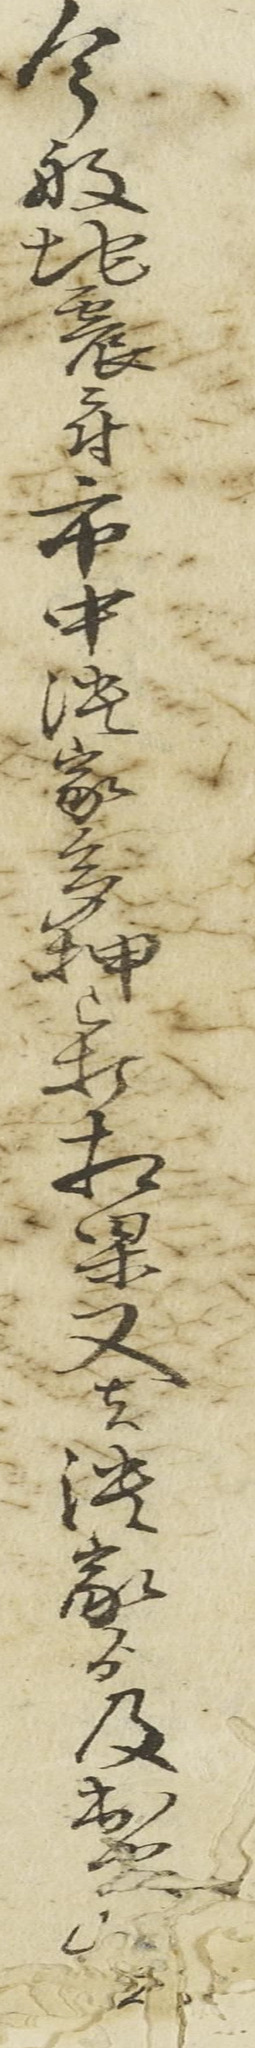今般地震ニ付市中潰家多押被打相果又は潰家ゟ及出火
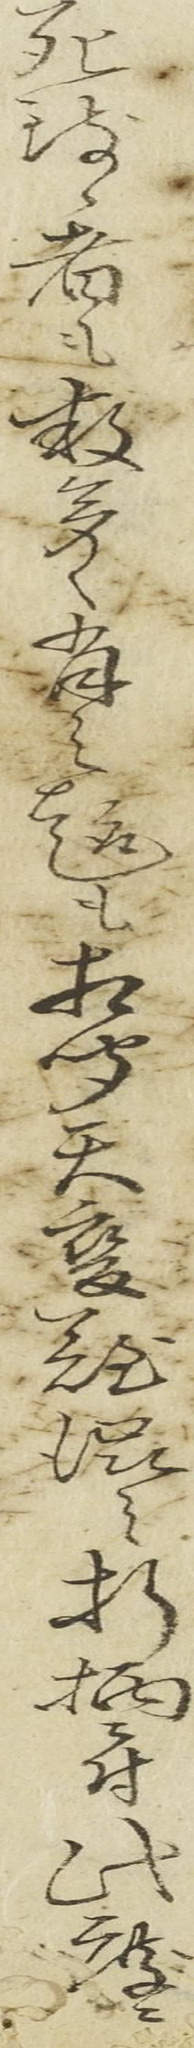死致候者も数多く有之趣も相聞天変難渋之折柄ニ付此度ニ
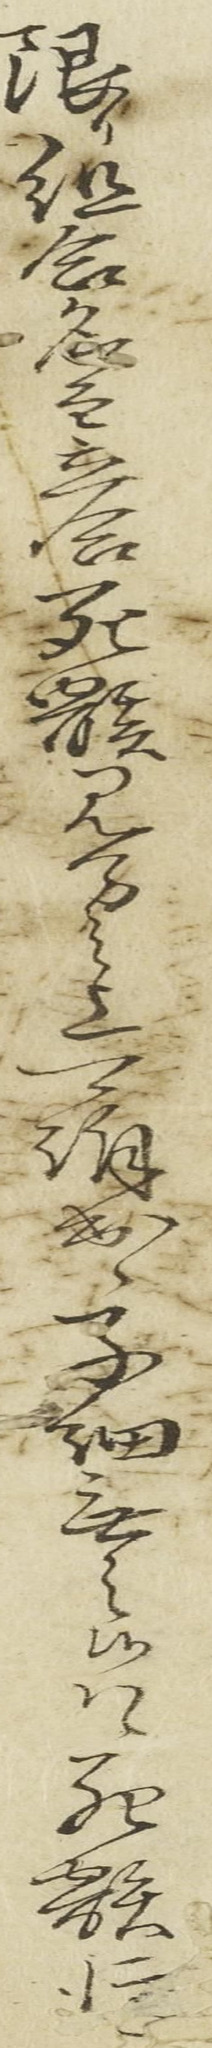限り組合名主立合死骸見分之上可訴出候子細無之候ハヽ死骸片
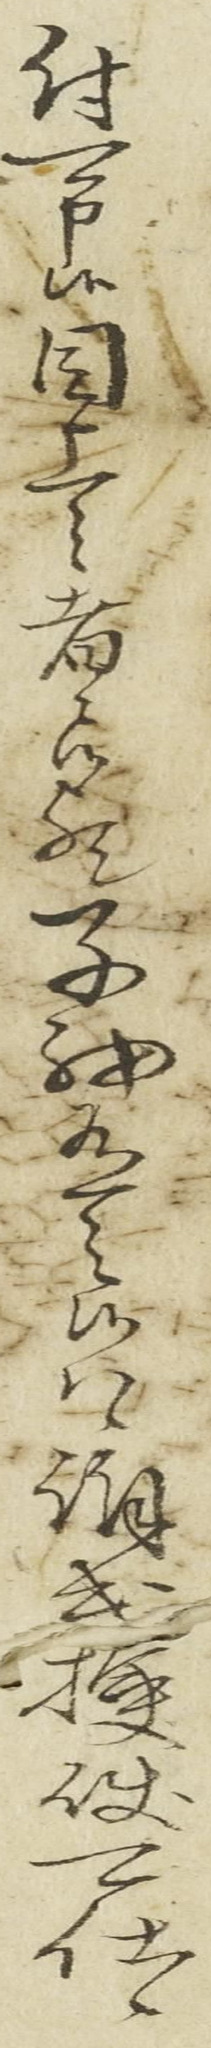付可申候目上之者ニ候歟子細有之候ハヽ訴出検使可仕候
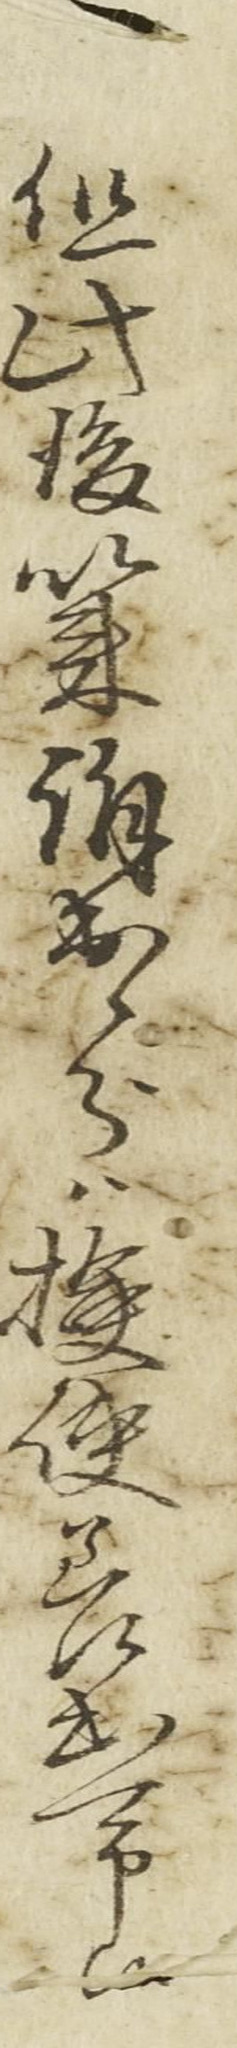但此後以来訴出候分ハ検使差出可申候
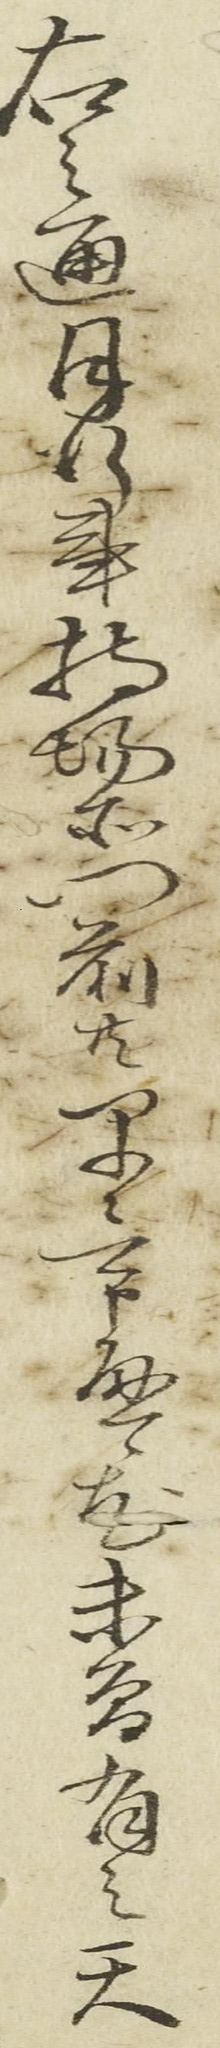右之通月行事持場所門前共早々可申通候尤未曽有之天
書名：安政二乙卯年十月二日大地震之事
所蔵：東京大学地震研究所図書室 Earthquake Research Institute Library, The University of Tokyo, JAPAN
